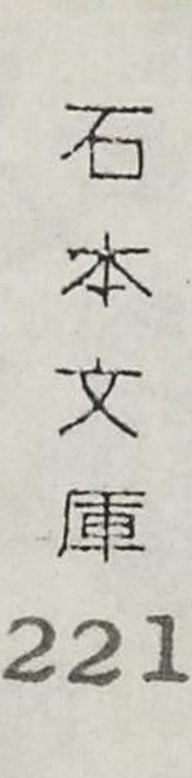石本文庫

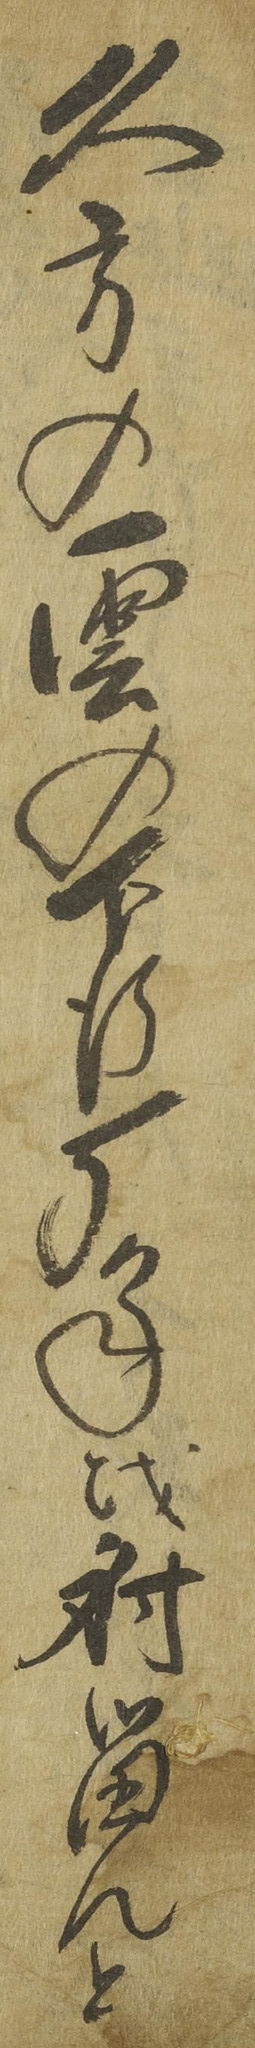久方の雲の下行雁かねを射留んと
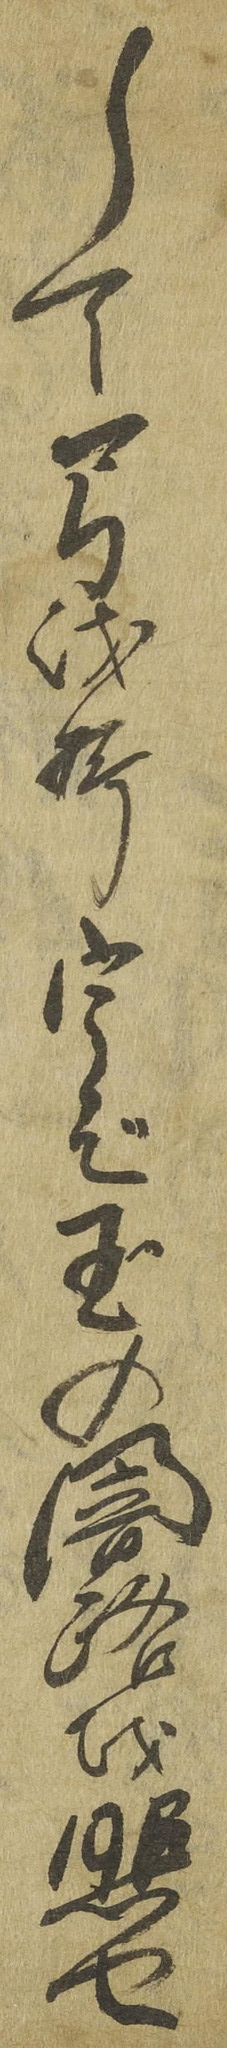して弓を折うば玉の闇路を照セ
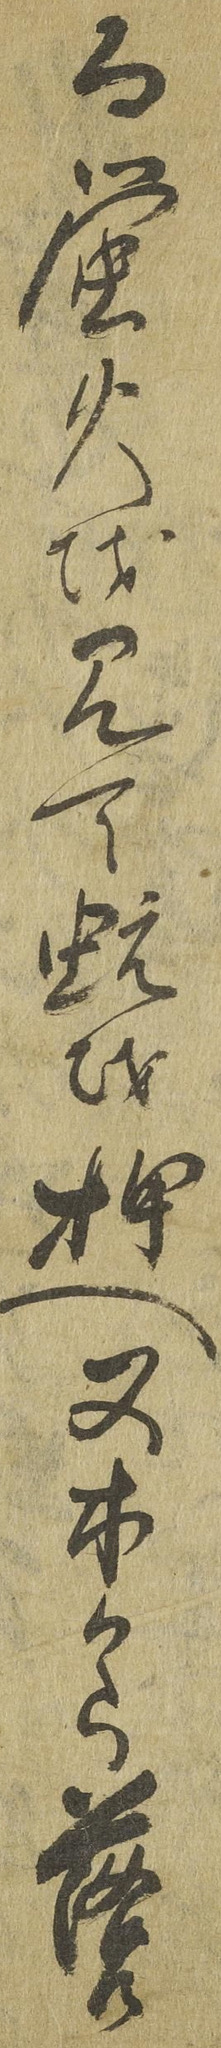る蛍火を見て蛻を押へ又木から落け
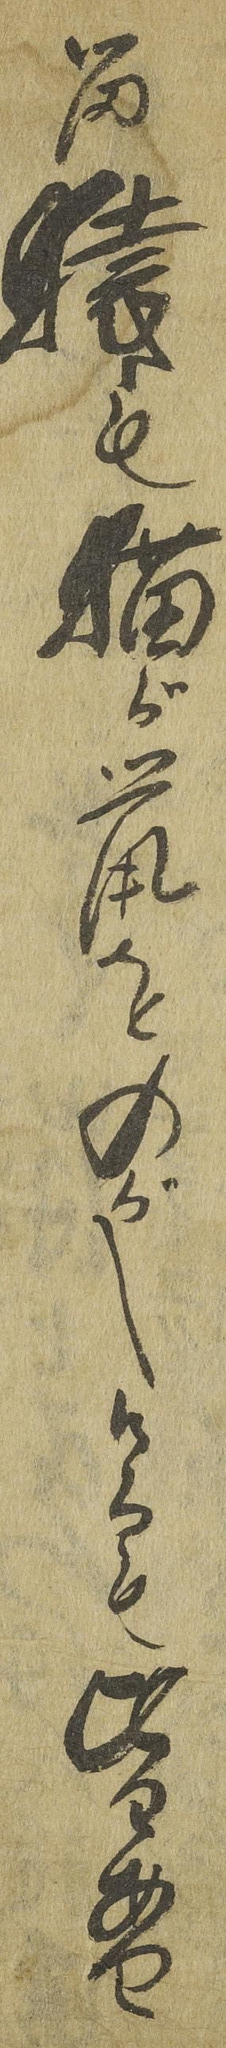る猿も猫が鼠をのがしけるも皆あセ
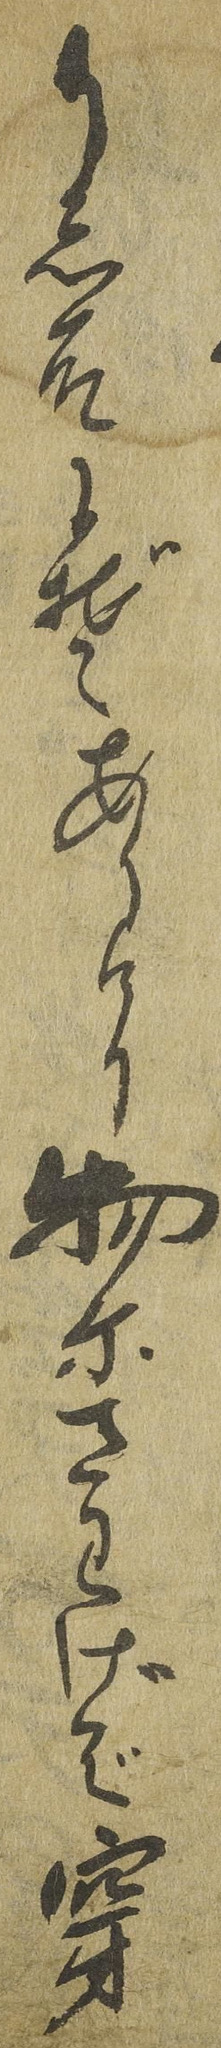りし故にぞありけり物にさわげば穿
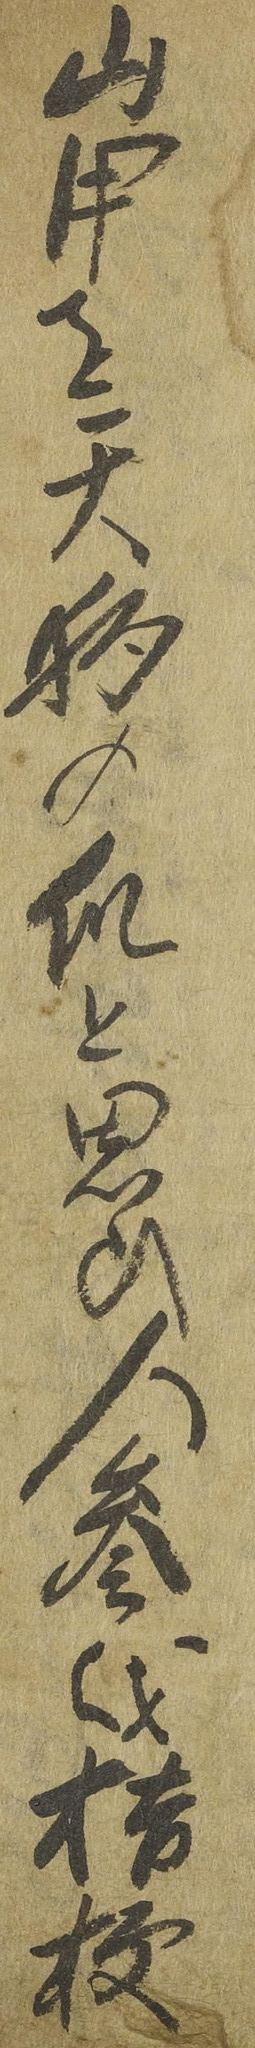山甲を天狗の爪と思ひ人参を桔梗
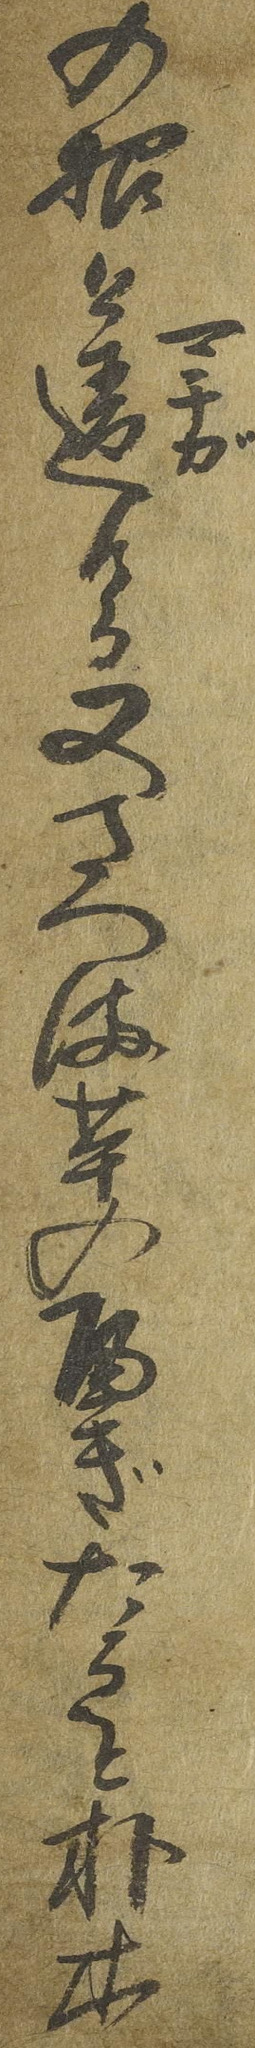の根と違ける又さつま芋のへぎたるを朴木

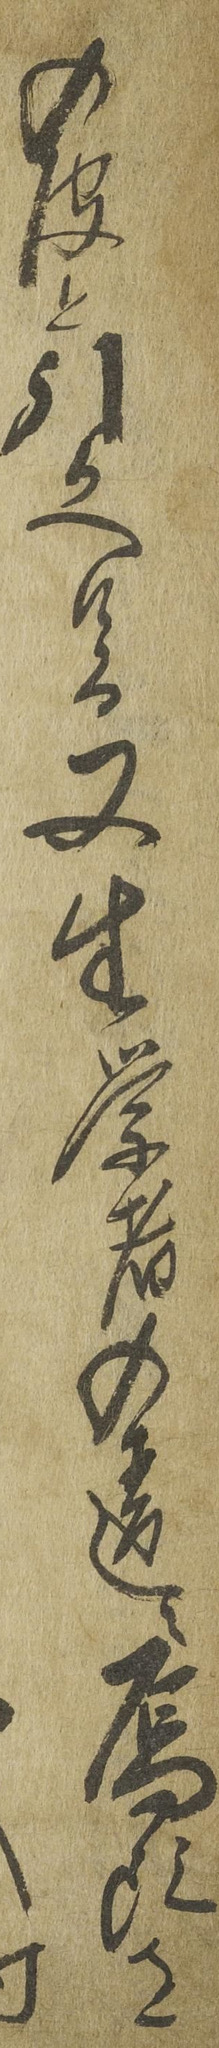の皮と引かへける又生学者の違ニ鷹頭を
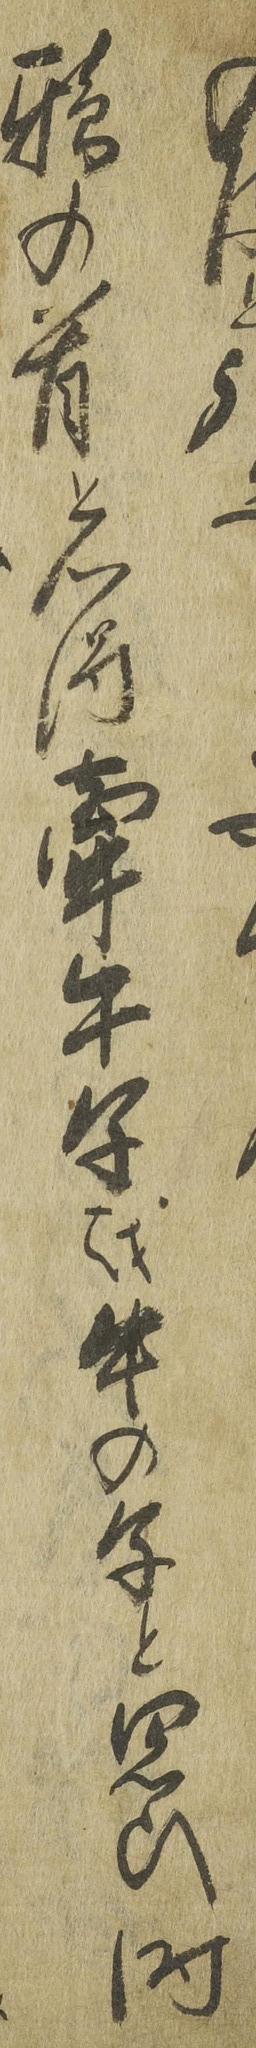鴉の首と心得牽午子を牛の子と思ひ時
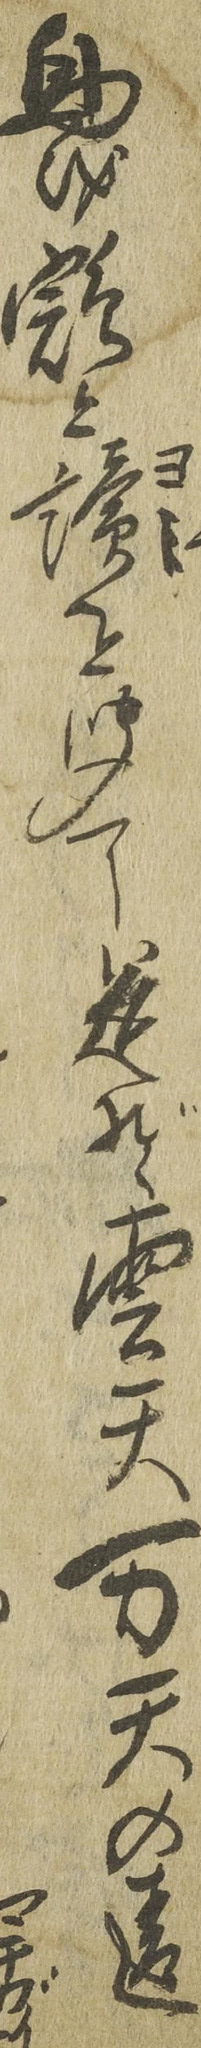鳥を鶏と読を聞て是ぞ雲天万天の違ト
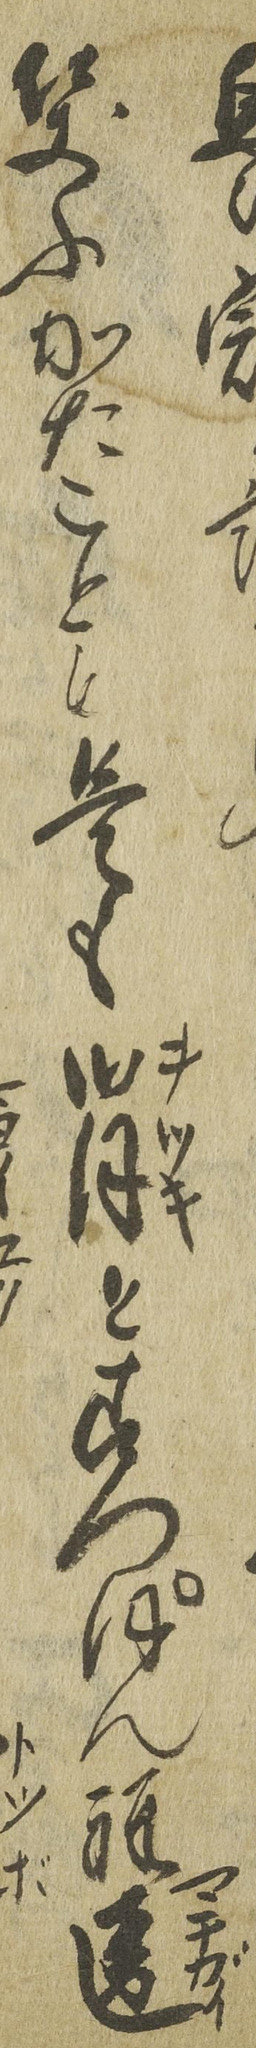笑ふかたことも是も御月とすつぽん程違
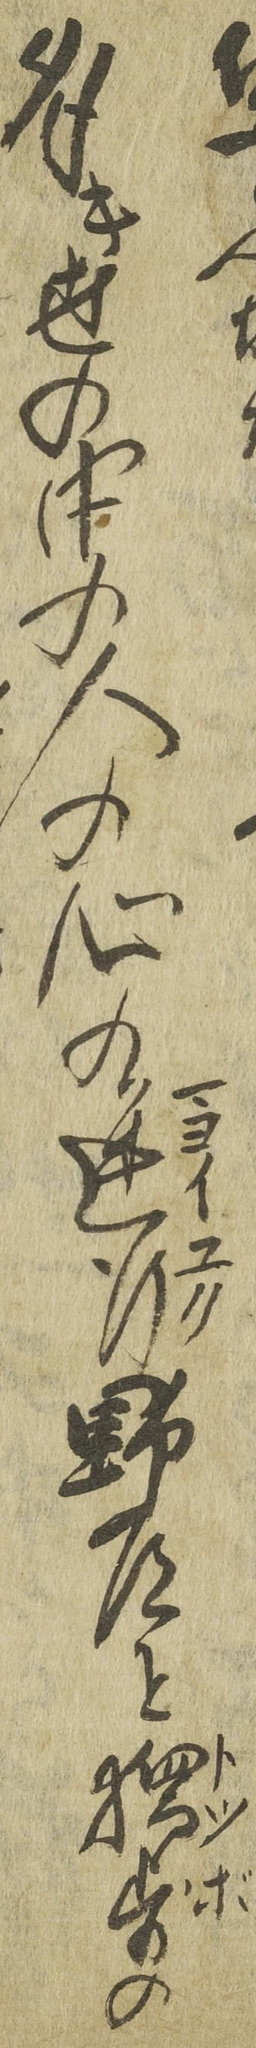多キ世の中の人の心の迷行野道を独歩の
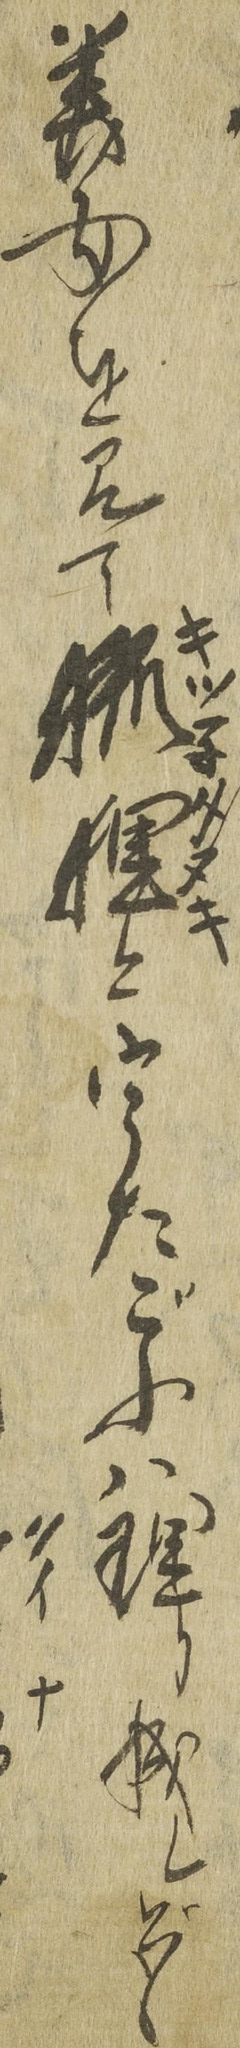美女を見て狐狸とうたごふは理り成レども
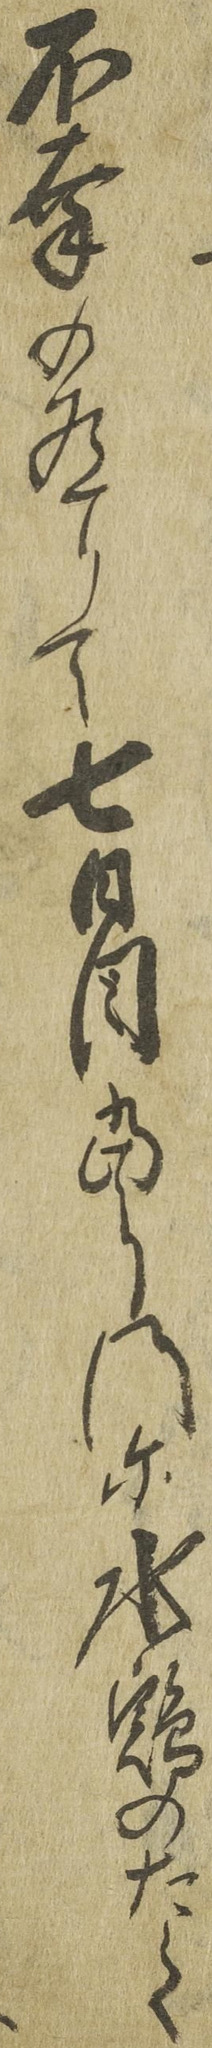不幸の有りて七日目当り門に水鶏のたて
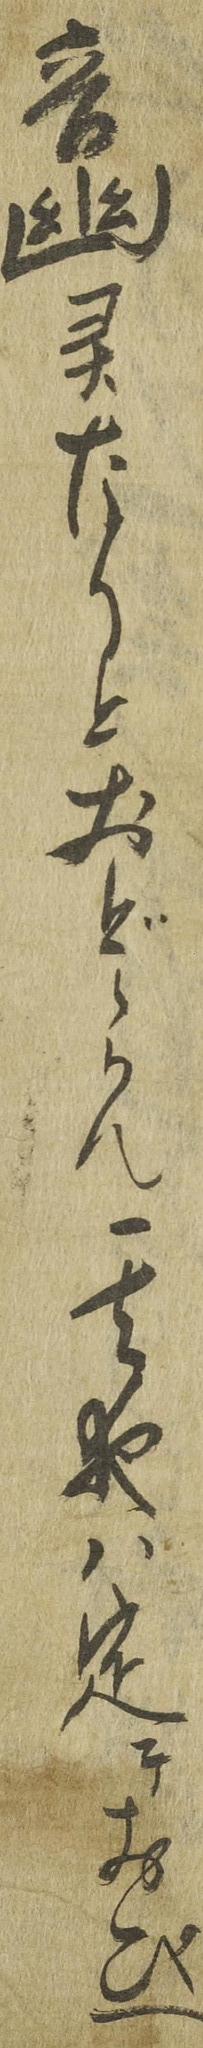音幽霊なりとおどろかん其夜は定テおびへ
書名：善光寺地震聞書
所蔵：東京大学地震研究所図書室 Earthquake Research Institute Library, The University of Tokyo, JAPAN
